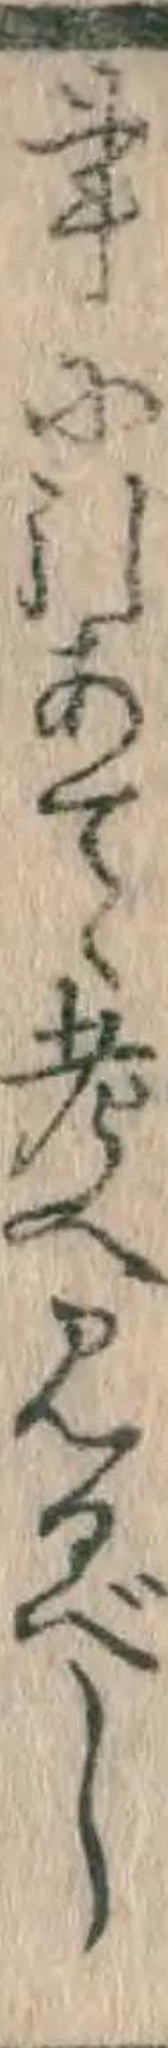事に引あてゝ考へ見るべし
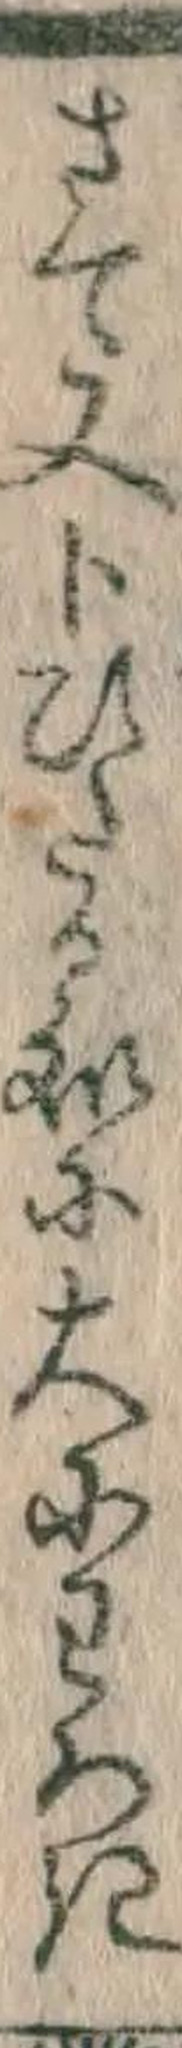さて又卜ひたる処に大小わろき
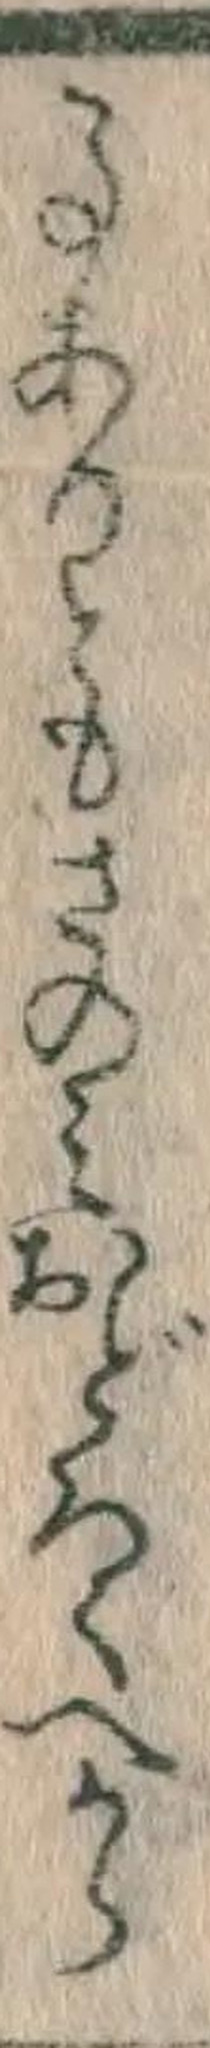事ありともさのみおどろくへから
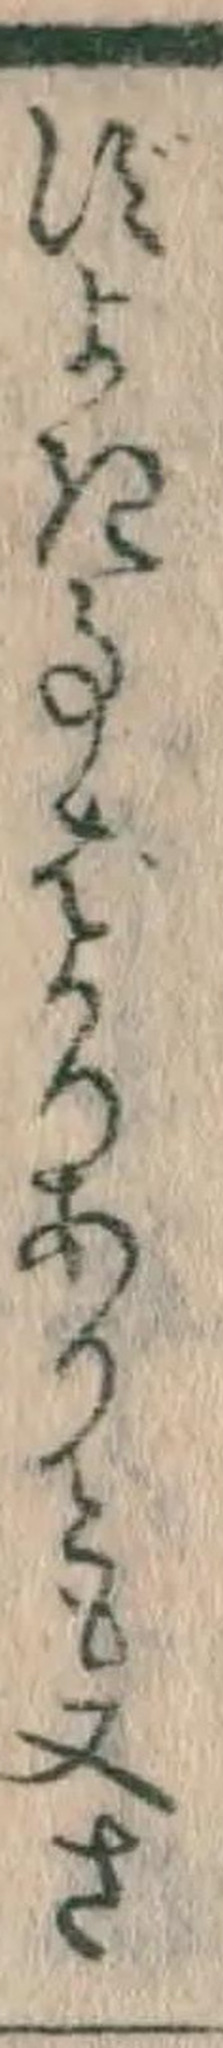ずよき事ばかりありとも又さ
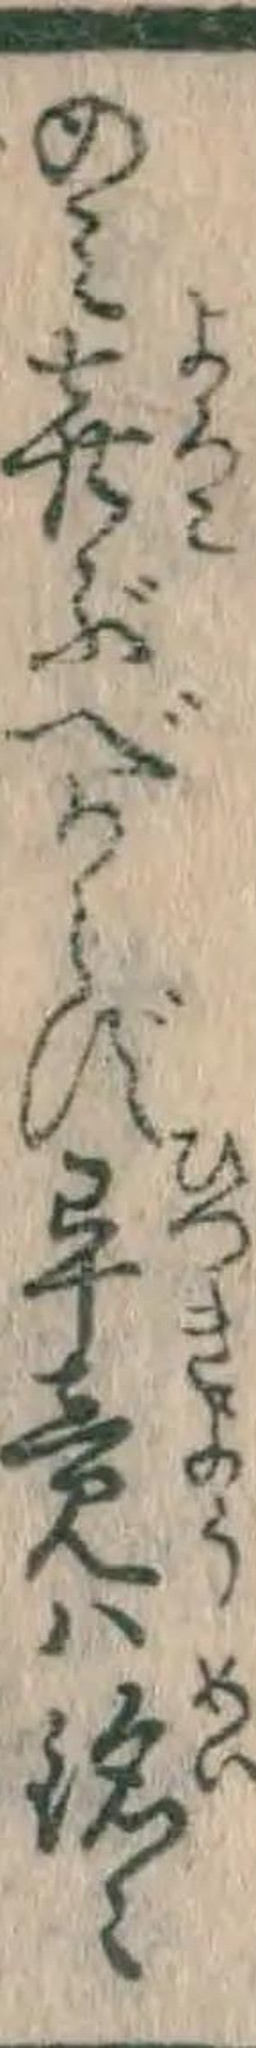のみ喜ぶべからず畢意は銘々
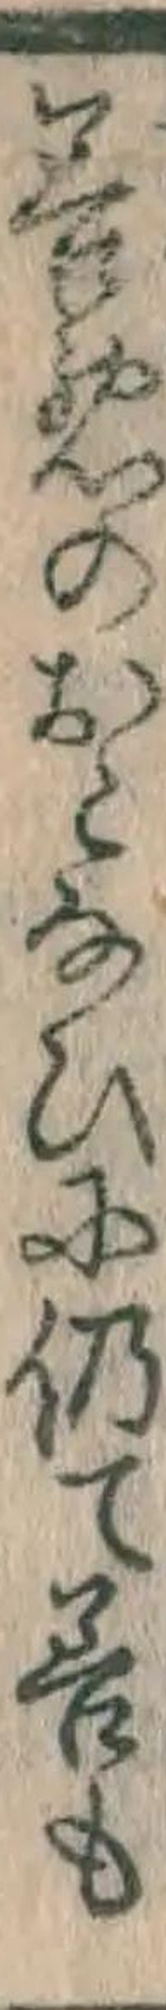善悪のおこなひに仍て善も

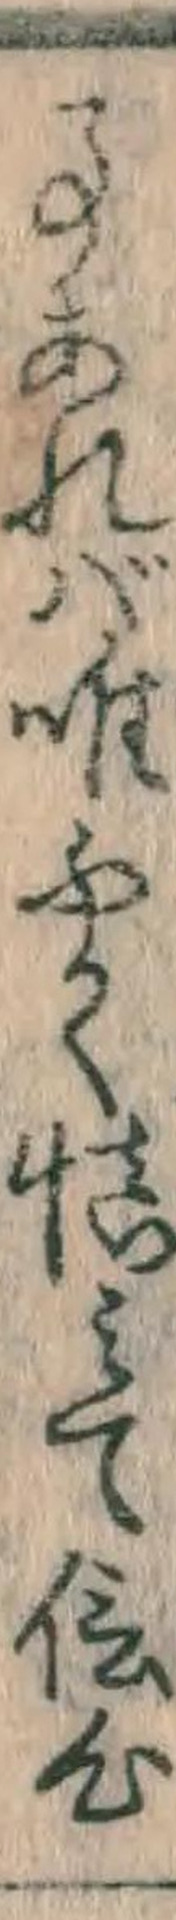事あれば唯ふかく慎みて信心
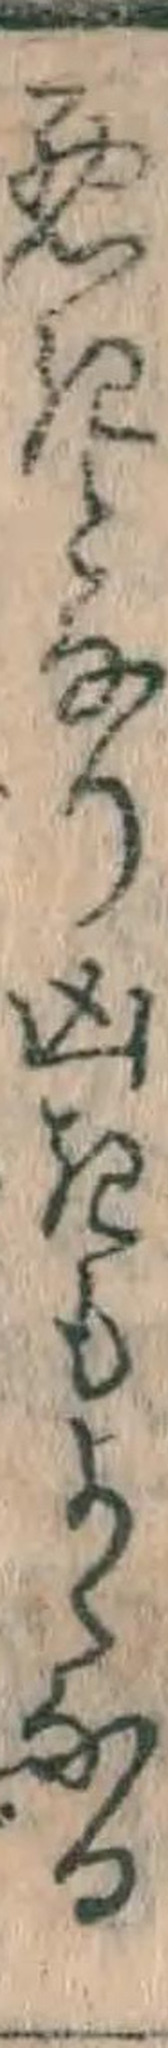悪きとなり凶きもよくなる
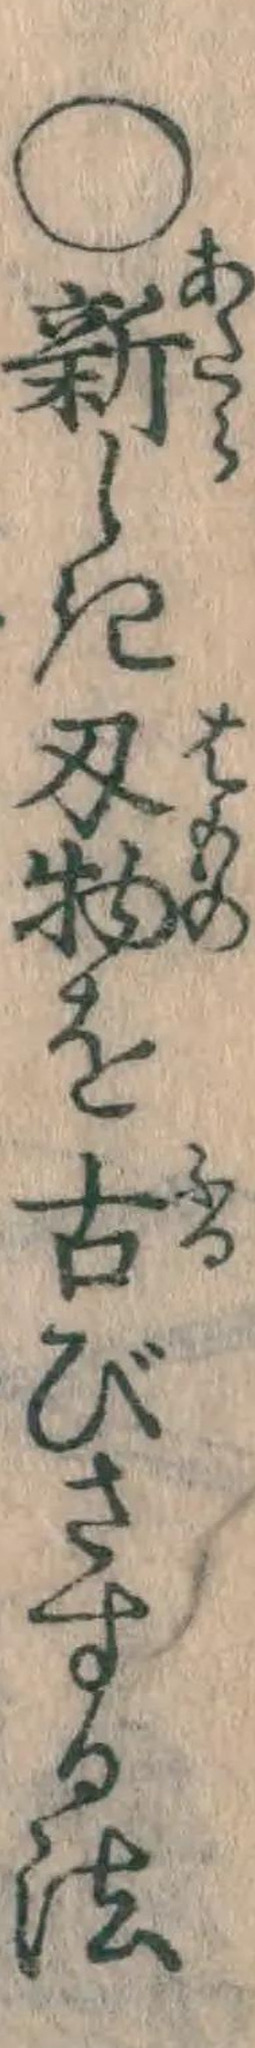○新しき刃物を古びさする法
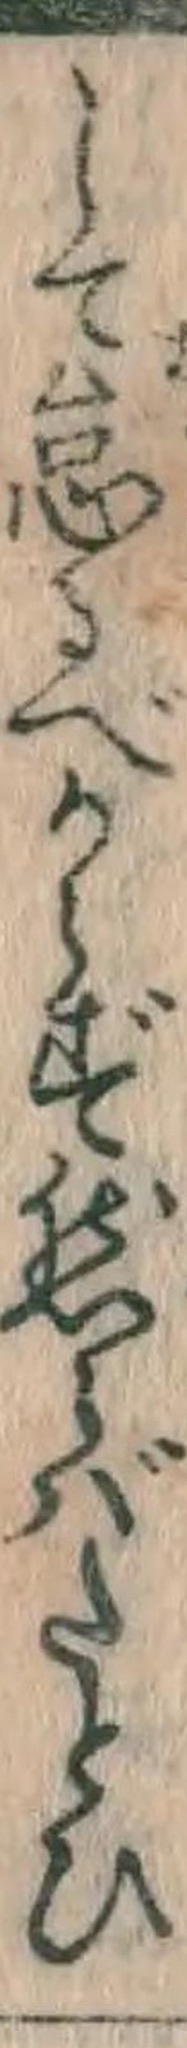して怠るべからず然らばたとひ
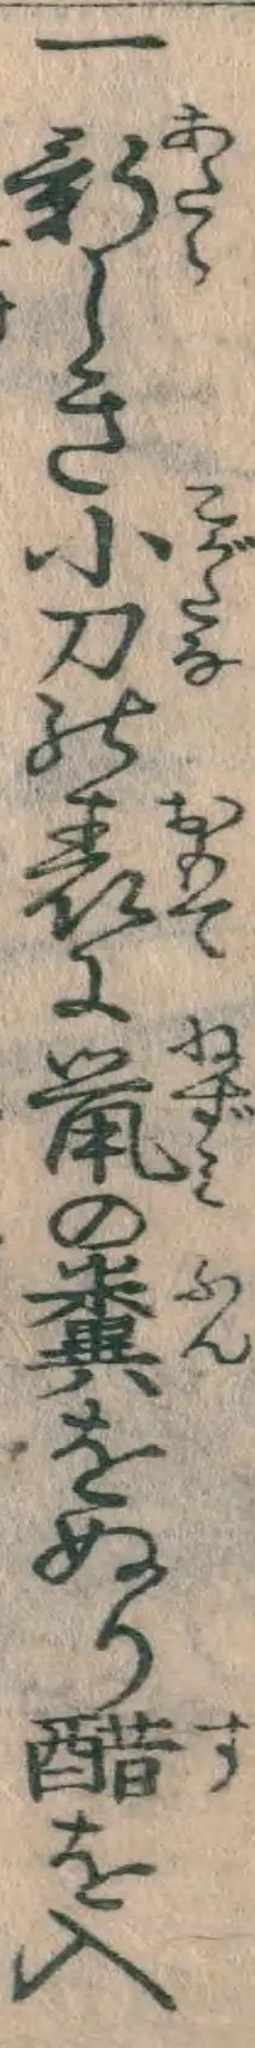一新しき小刀の表に鼠の糞をぬり醋を入
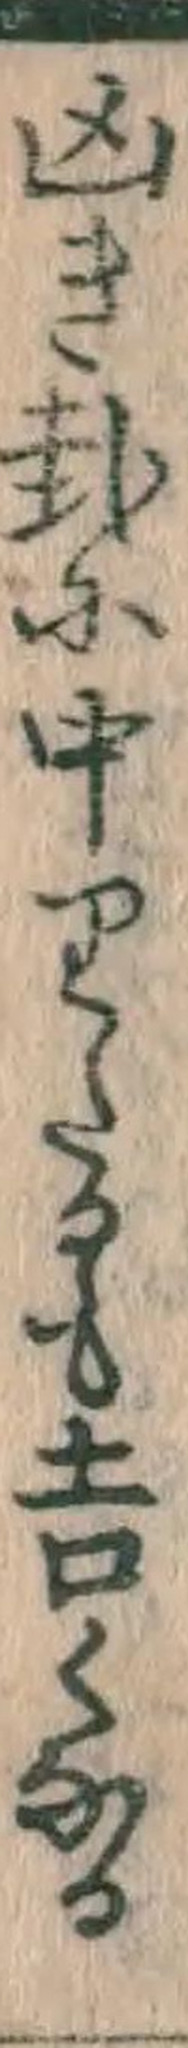凶き卦に中りたるも吉くなる
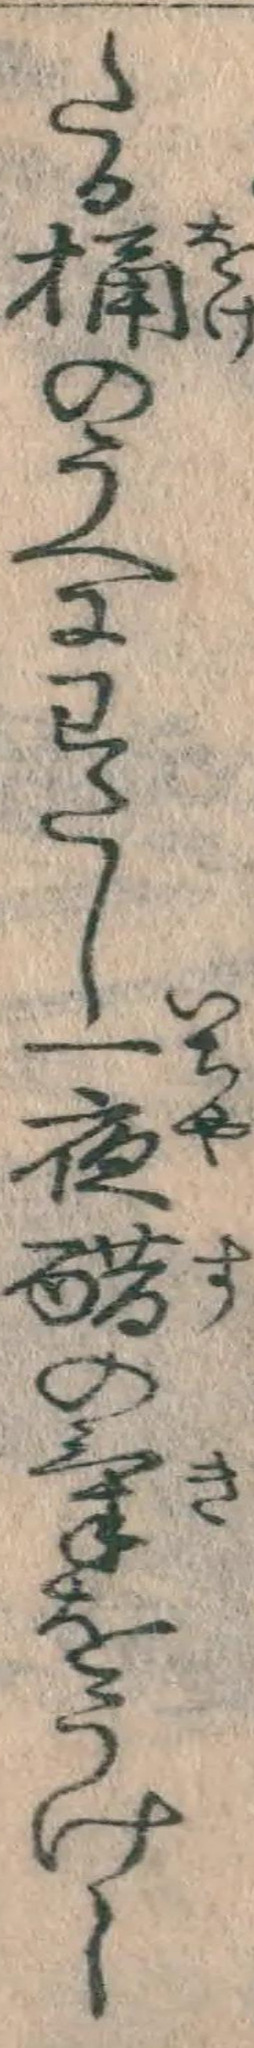たる桶のうへにわたし一夜醋の気をうけし
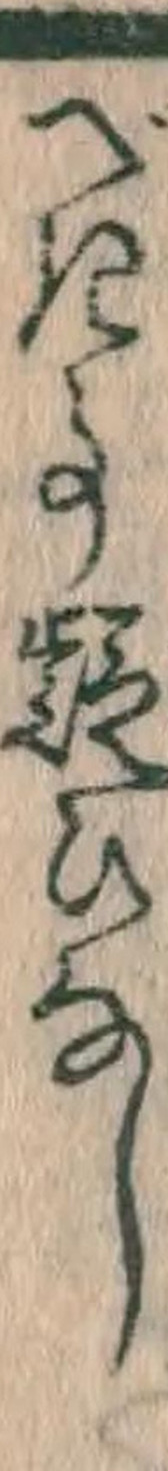べき事疑ひなし
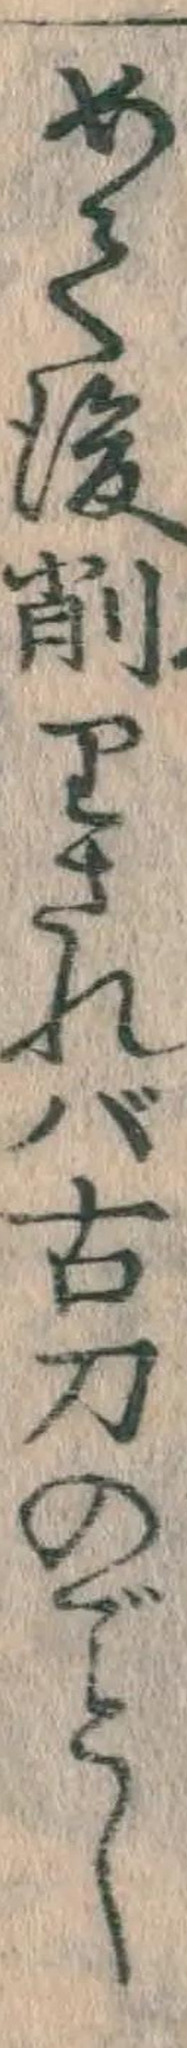めて後削りされば古刀のごとし
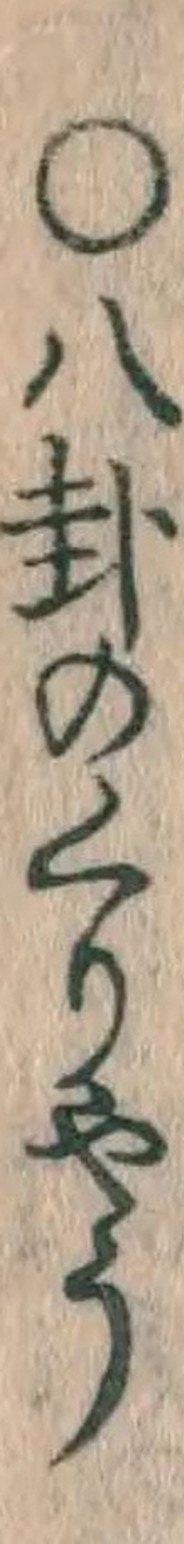○八卦のくりやう
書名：広益秘事大全 3巻. [1]
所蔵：国立国会図書館 National Diet Library, JAPAN
